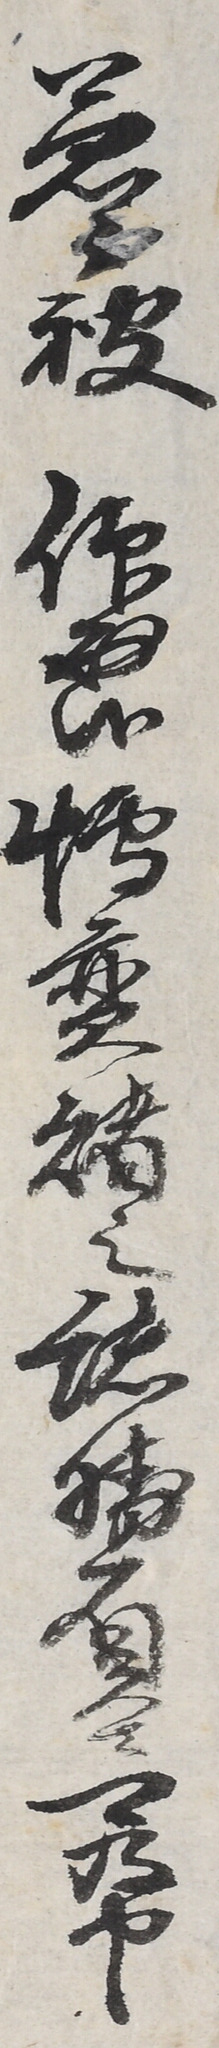兼而被仰出候博奕賭之諸勝負者可為申
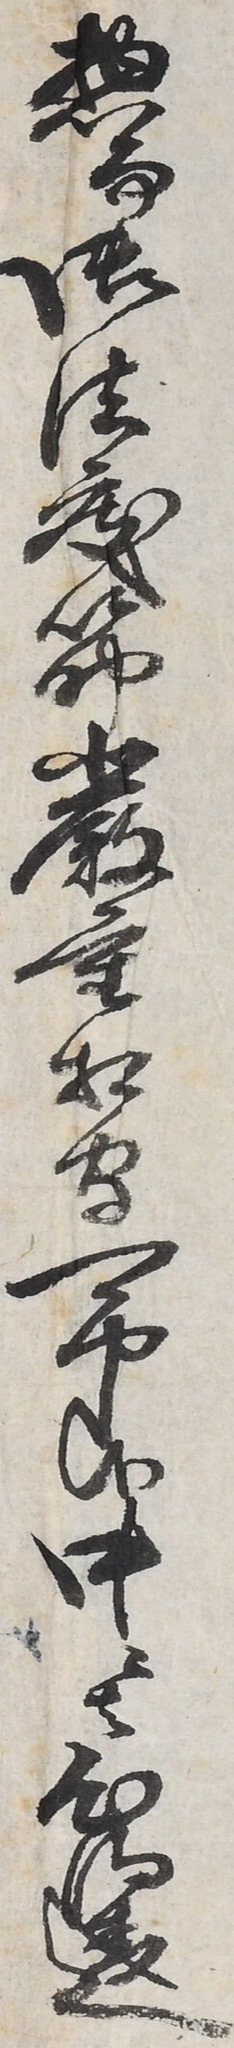惣而御法度筋厳重相守可申候中ニ者心得違
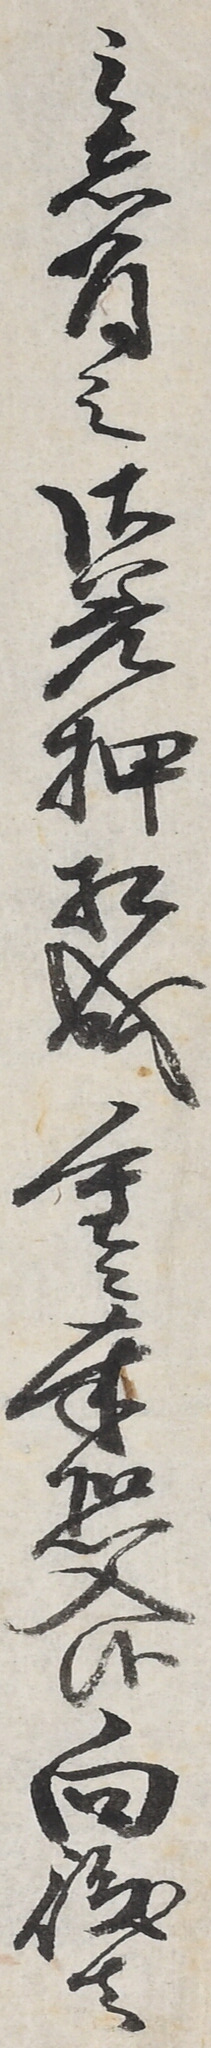之者有之御差押相成重々奉恐入候向後者
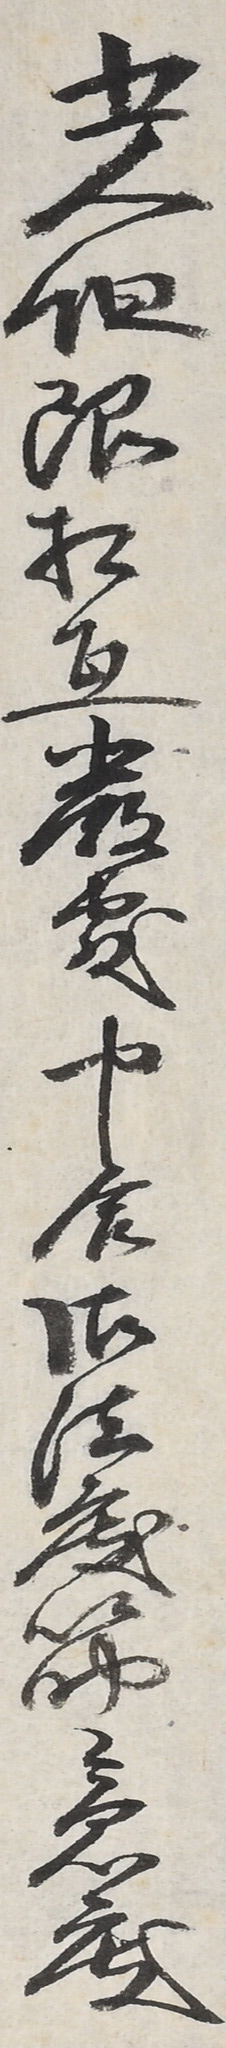五人組限相互厳敷申合御法度筋急度
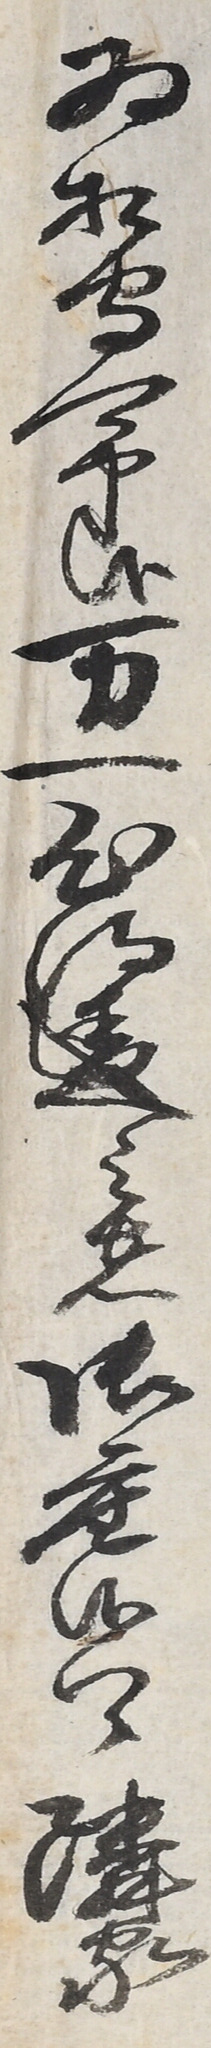為相守可申候万一心得違之者御座候ハゝ隣家
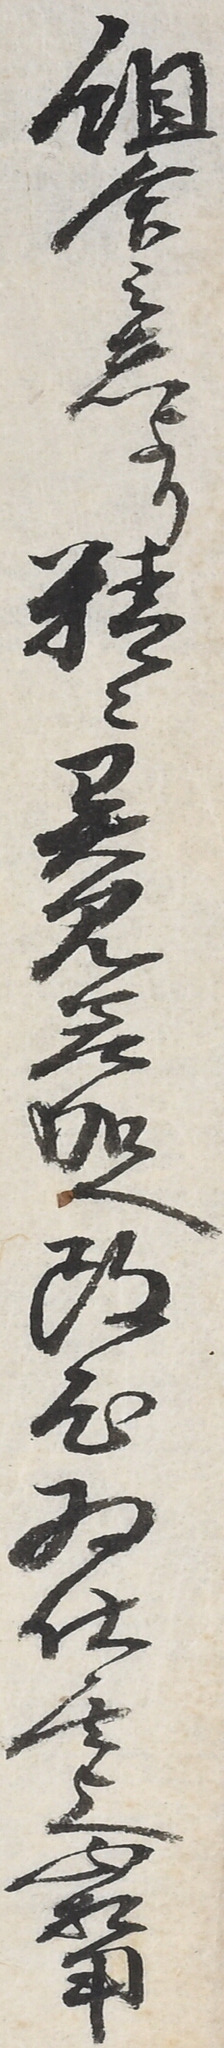組合之者より精々異見差加へ改心為仕其上不相用
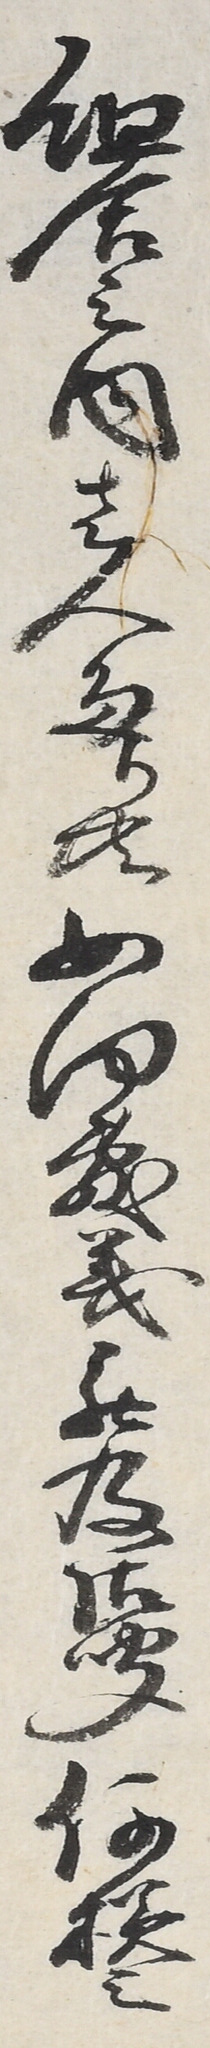組合之内壱人たり共如何敷義罷及御聞何様之
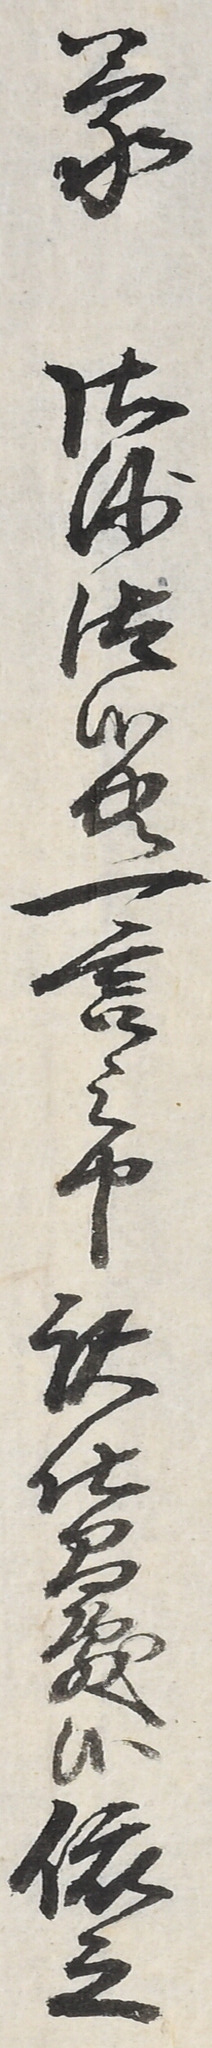蒙御沙汰候共一言之申訳仕間敷候依之
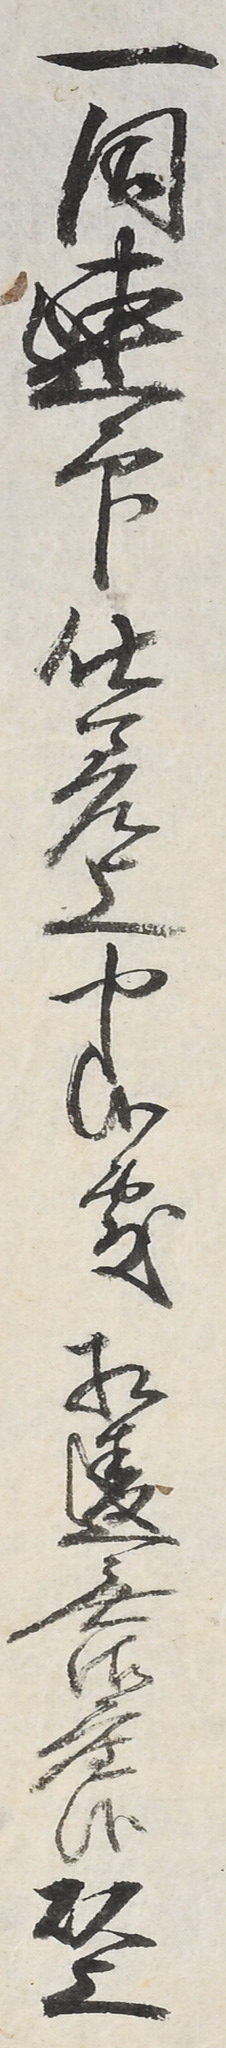一同連印仕差上申候処相違無御座候以上
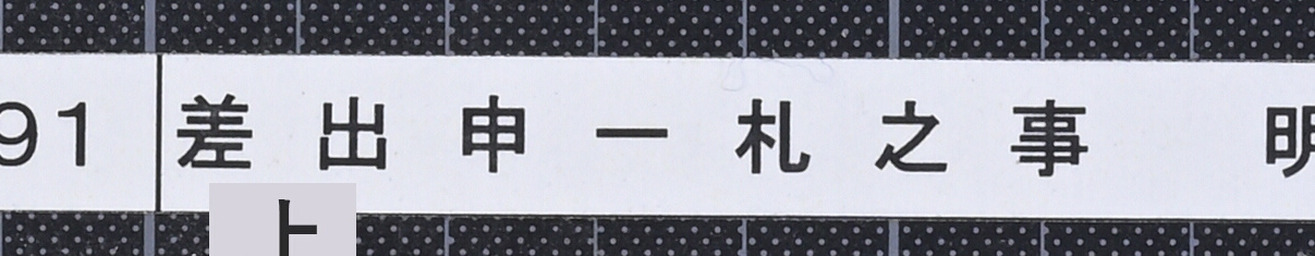差上申一札之事

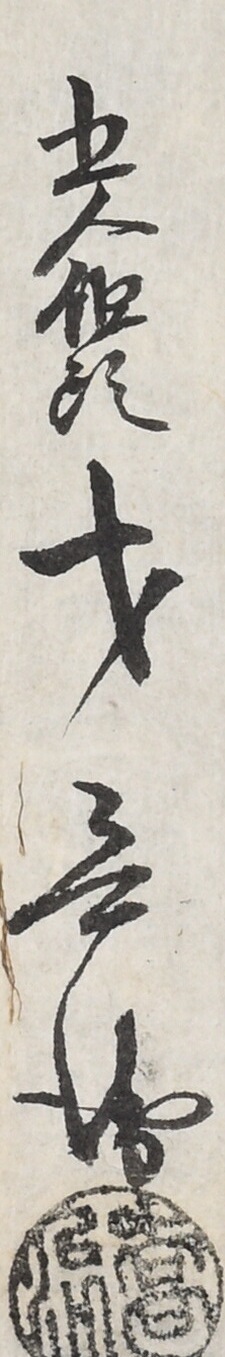五人組頭才兵衛㊞
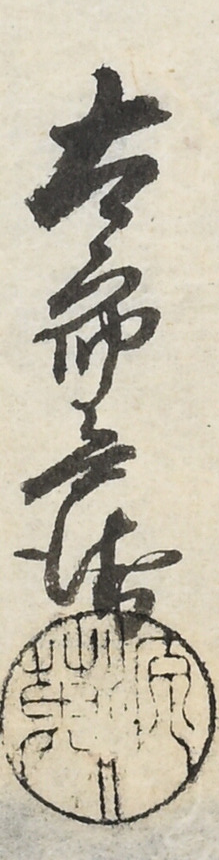太郎兵衛㊞
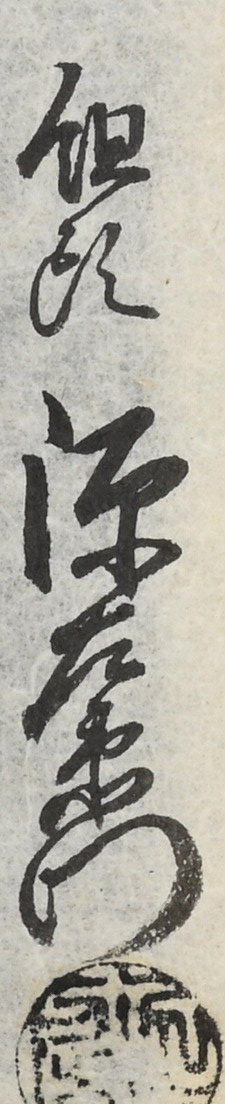組頭源左衛門㊞

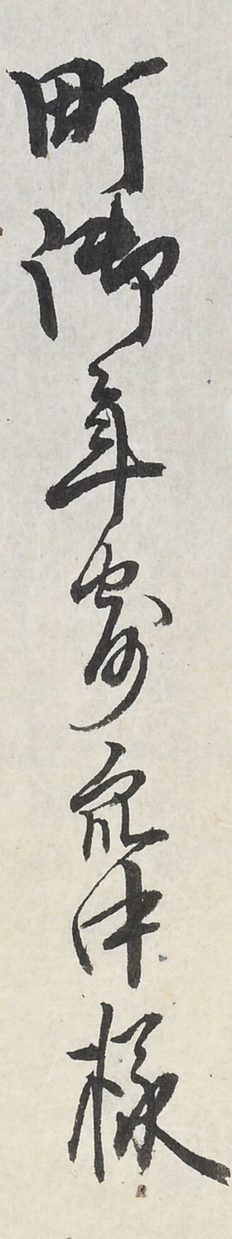町御年寄衆中様
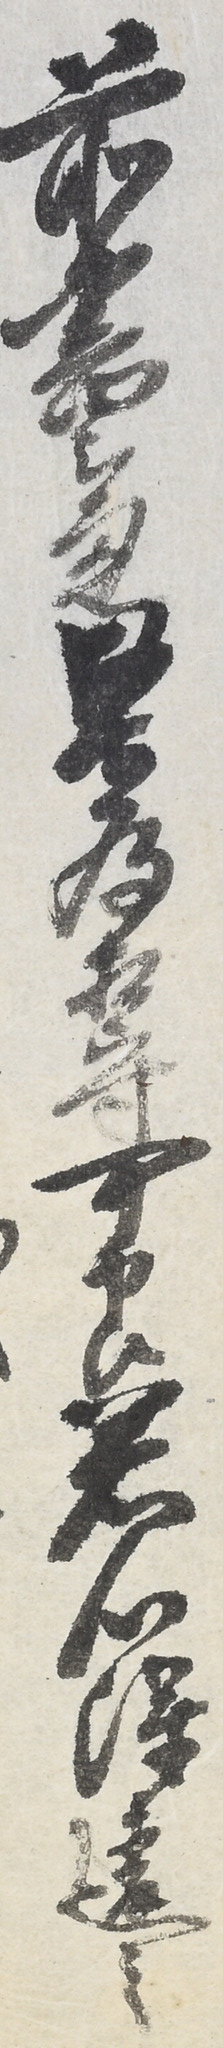前書之通堅為相守可申候若心得違之
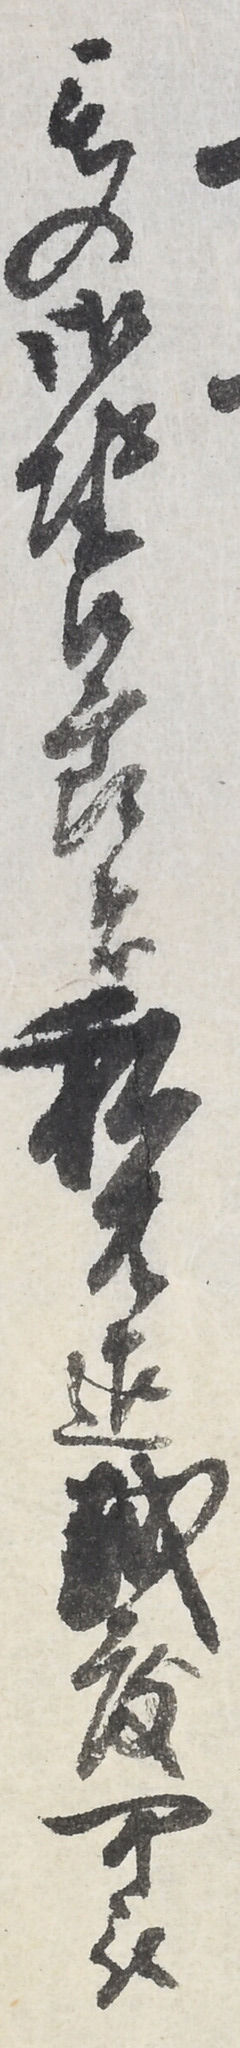もの御座候節者私共迄越度可被
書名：差上申一札之事
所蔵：伊那市立高遠町図書館・合同会社AMANE
